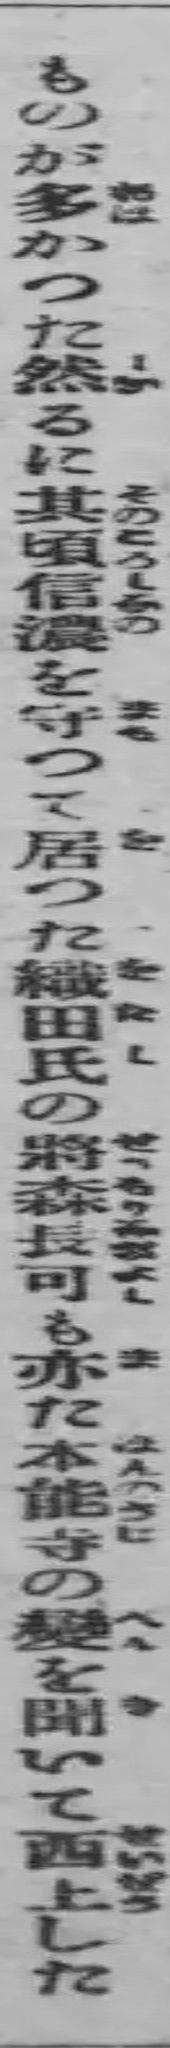ものが多かつた然るに其頃信濃を守つて居つた織田氏の将森長可も亦た本能寺の変を聞いて西上した
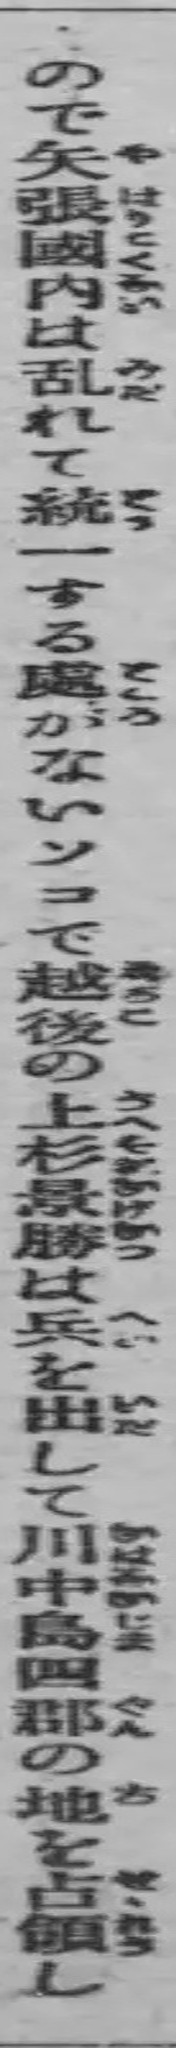ので矢張国内は乱れて統一する処がないソコで越後の上杉景勝は兵を出して川中島四郡の地を占領し
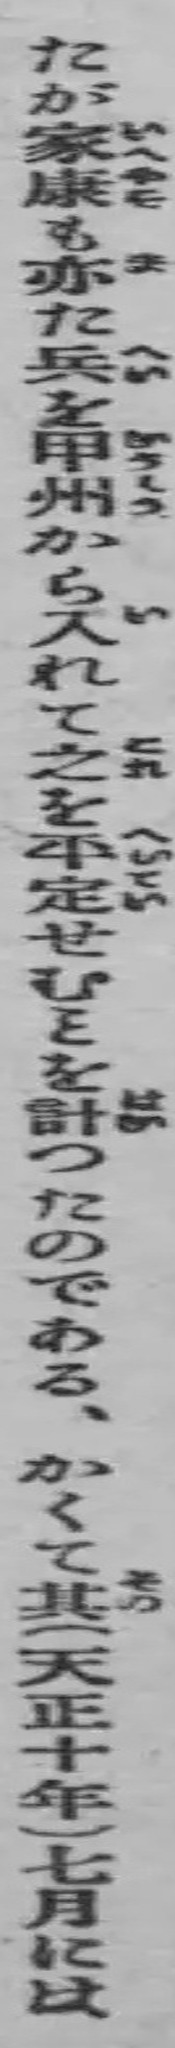たが家康も亦た兵をを甲州から入れて之を平定せむことを計つたのである、かくて其(天正十年)七月には
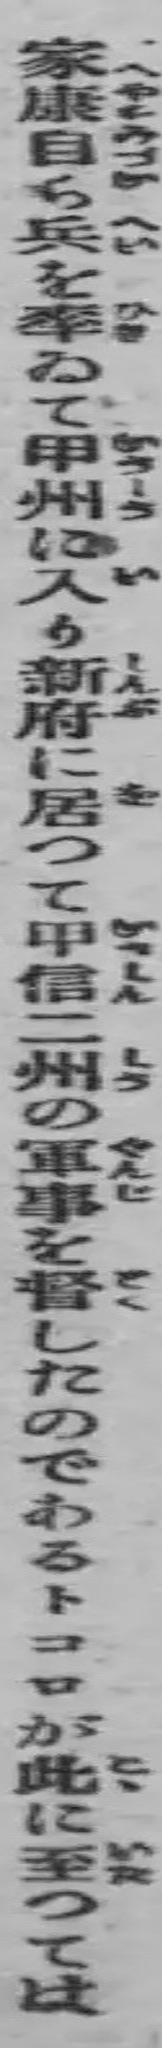家康自ら兵を率ゐて甲州に入り新府に居つて甲州二州の軍事を督したのであるトコロが此に至つては
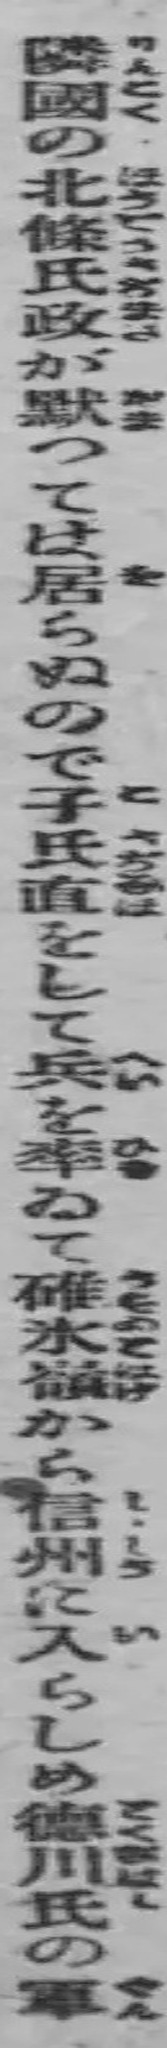隣国の北條氏政が黙つては居らぬので子氏直をして兵を率ゐて碓氷峠から信州に入らしめ徳川氏の軍
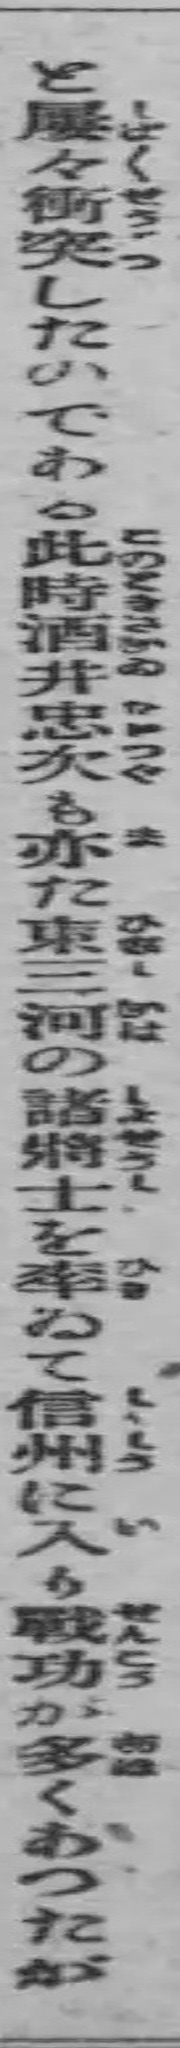と屡々衝突したのである此時酒井忠次も亦た東三河の諸将士を率ゐて信州に入り戦功が多くあつたが
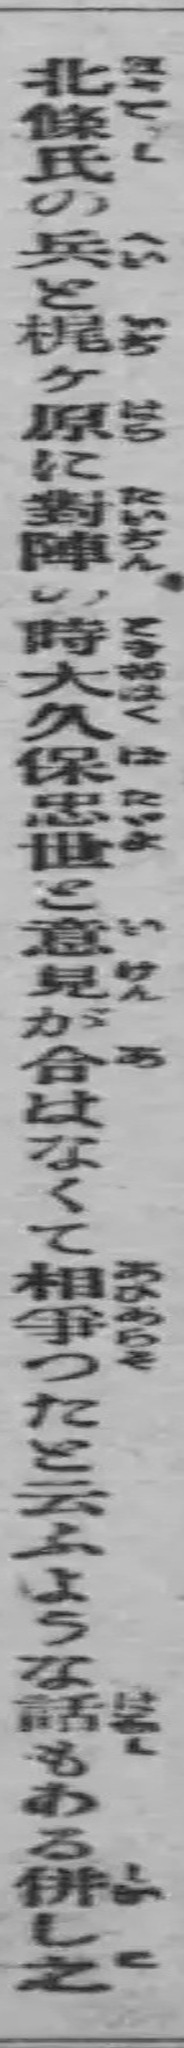北條氏の兵と梶ケ原に対陣の時大久保忠世と意見が合はなくて相争つたと云ふような話もある併し之
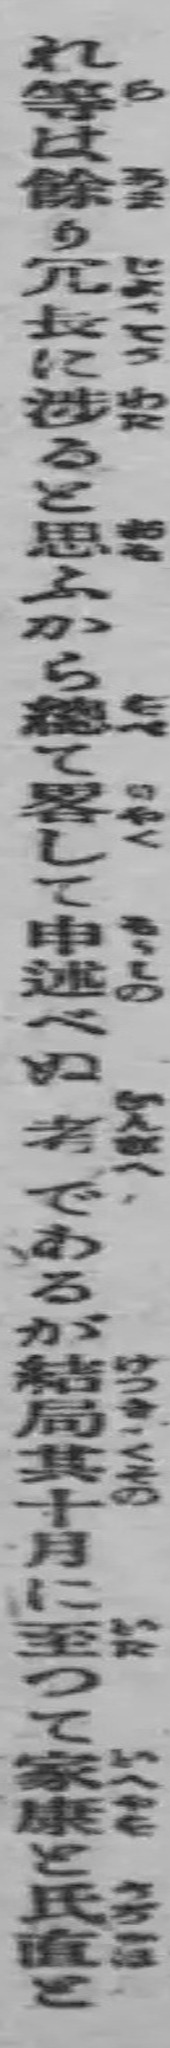れ等は余り冗長に渉ると思ふから総て略して申述べぬ考であるが結局其十月に至つて家康と氏直と
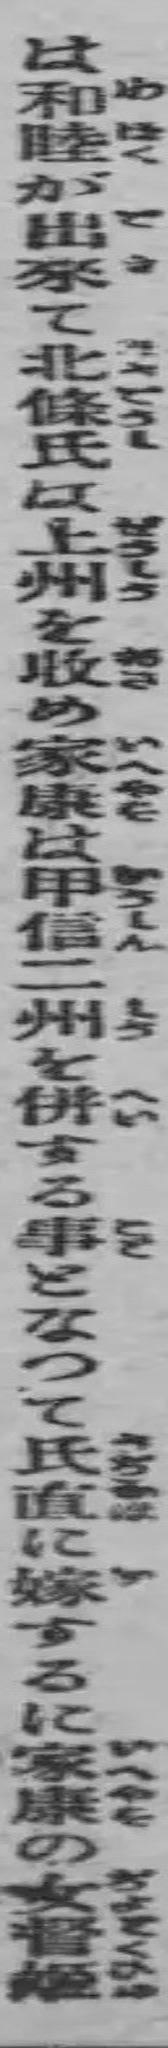は和睦が出来て北條氏は上州を収め家康は甲州二州を併する事となつて氏直に嫁するに家康の女督姫
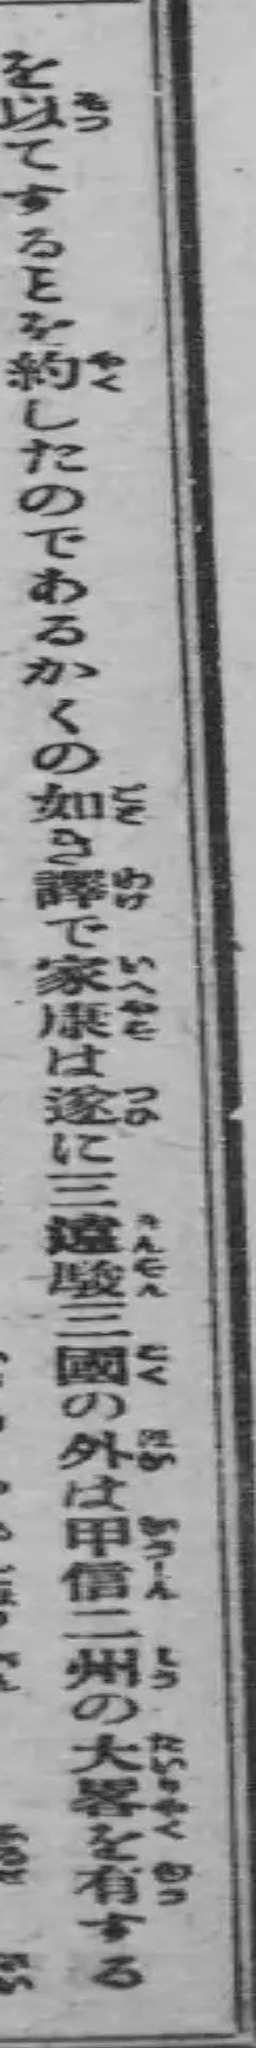を以てすることを約したのであるかくの如き訳で家康は遂に三遠駿三国の外は甲州二州の大略を有する
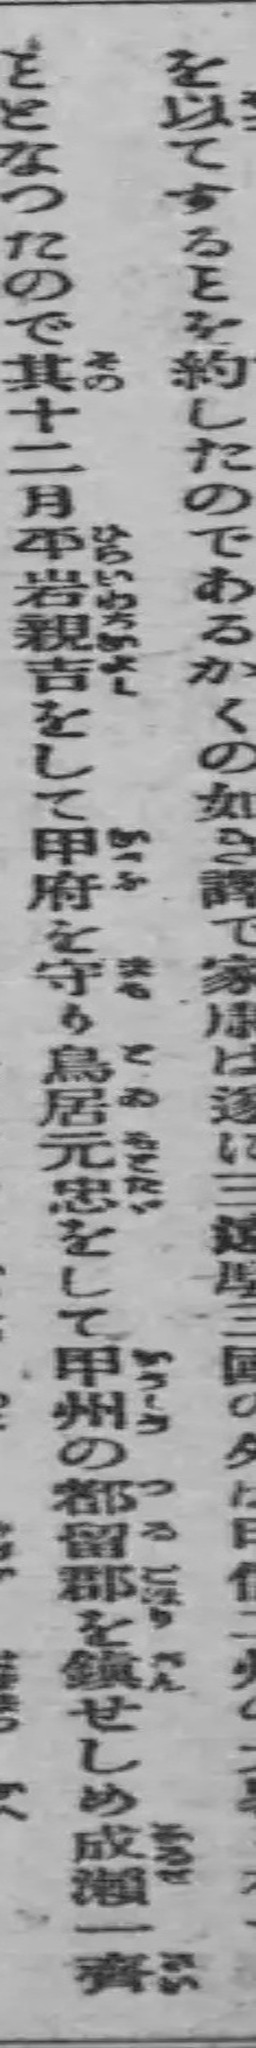こととなつたので其十二月平岩親吉をして甲府を守り鳥居元忠をして甲州の都留郡を鎮せしめ成瀬一斉
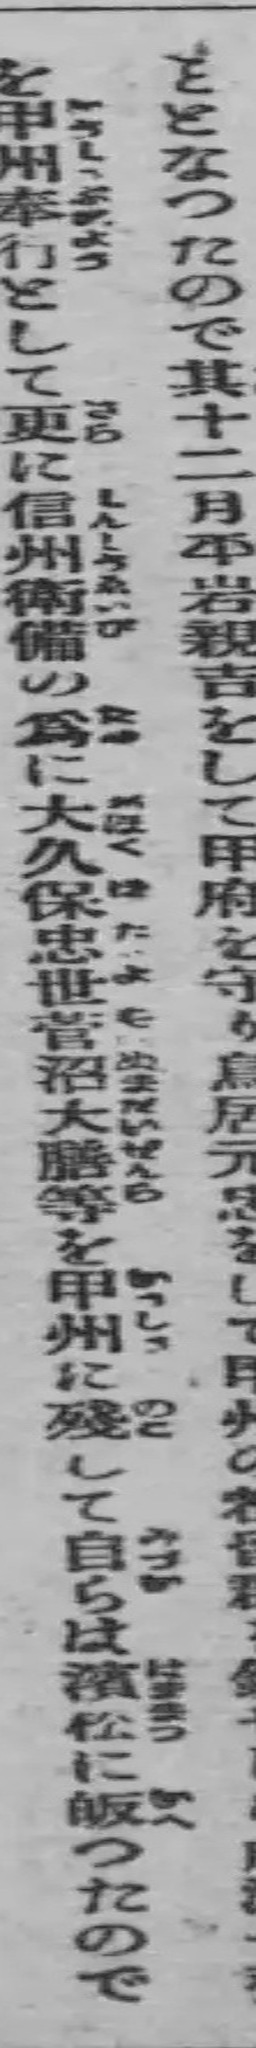を甲州奉行として更に信州衛備の為に大久保忠世菅沼大膳等を甲州に残して自らは浜松に皈つたので
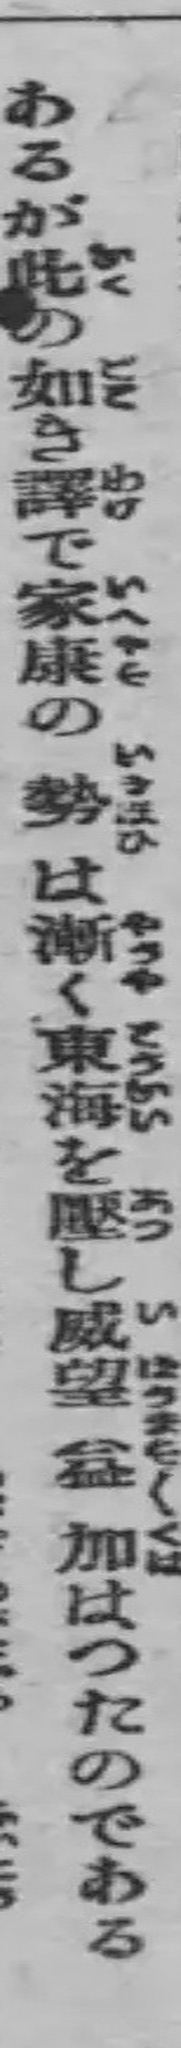あるが此の如き訳で家康の勢は漸く東海を圧し威望益加はつたのである
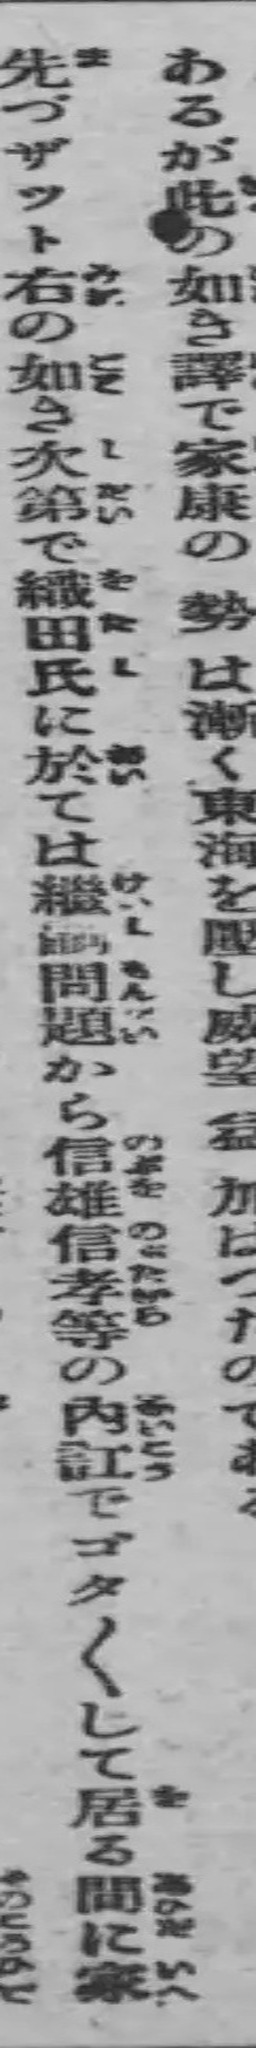先づザツト右の如き次第で織田氏に於ては継嗣問題から信雄信孝等の内訌でゴタ〳〵して居る間に家
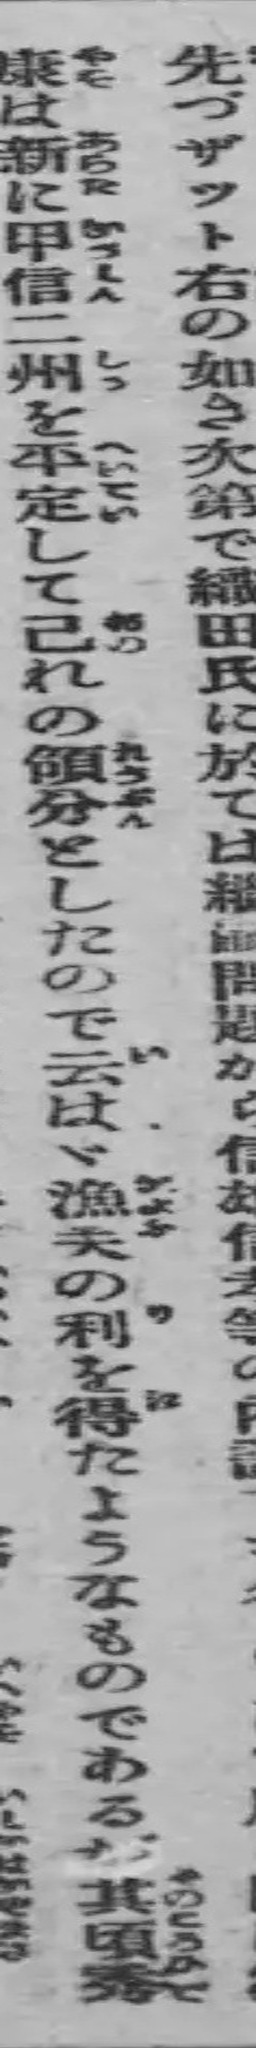康は新に甲州二州を平定して己れの領分としたので云はゞ漁夫の利を得たようなものであるが其頃秀
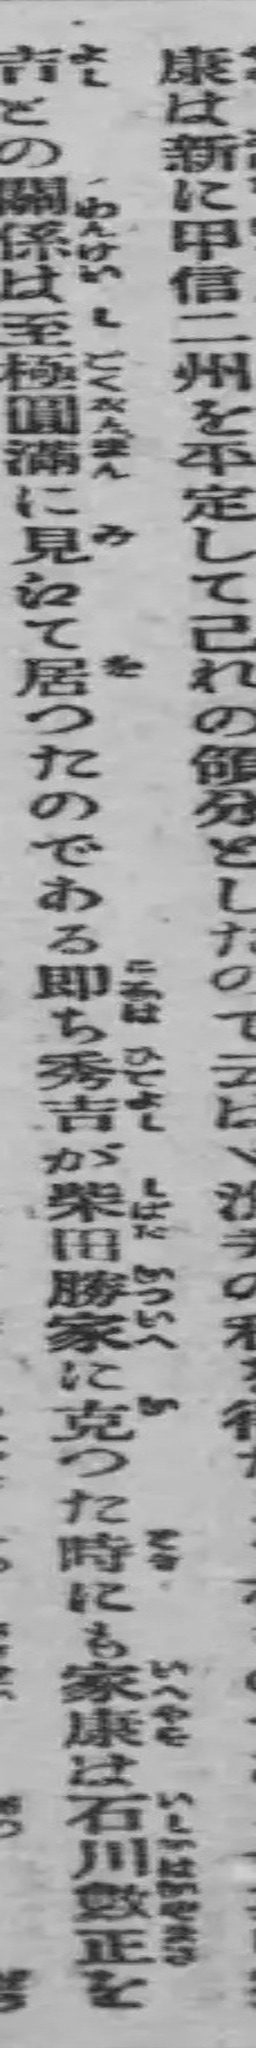吉との関係は至極円満に見えて居つたのである即ち秀吉が柴田勝家に克つた時にも家康は石川数正を
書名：豊橋市史談
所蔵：国立国会図書館 National Diet Library, JAPAN
